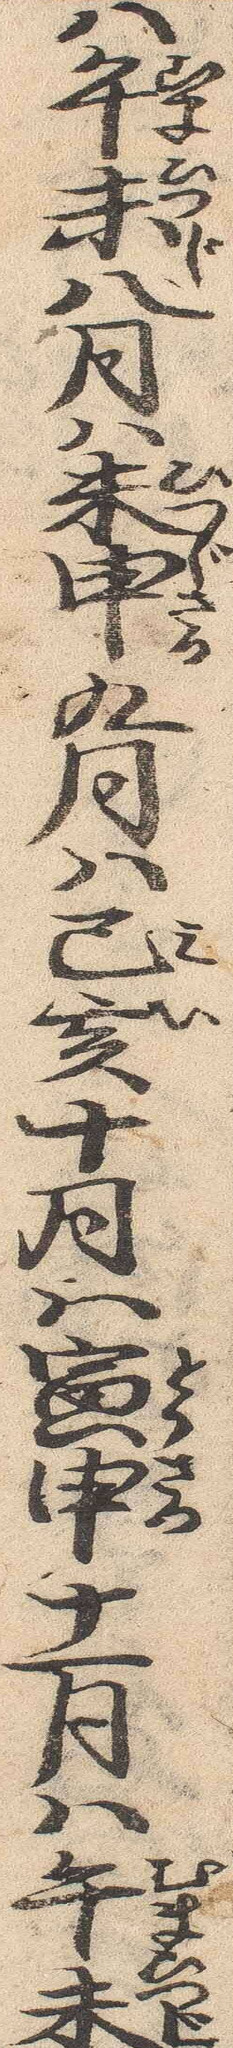は午未八月は未申九月は巳亥十月は寅申十一月は午未
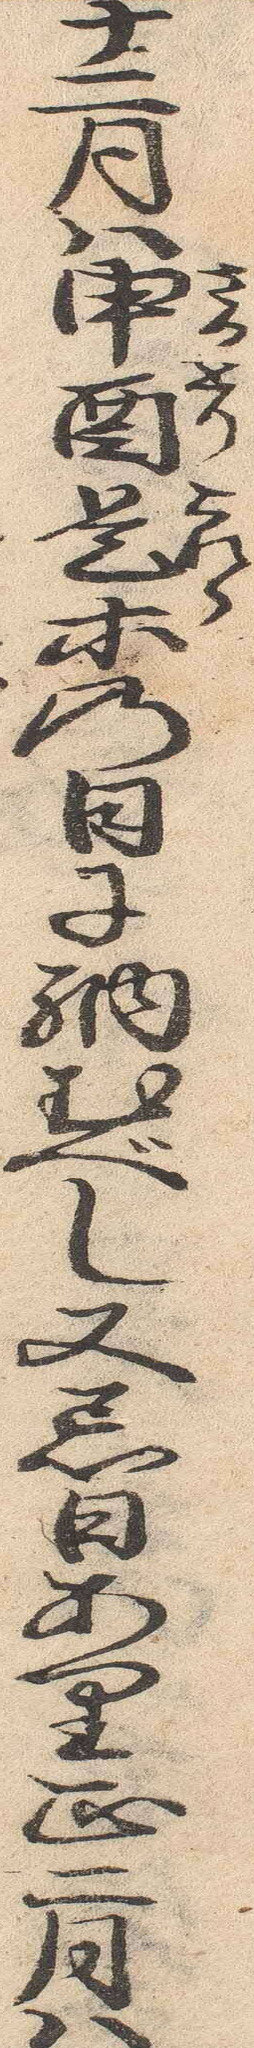十二月は申酉是等の月に納むべし又忌日あり正二月は
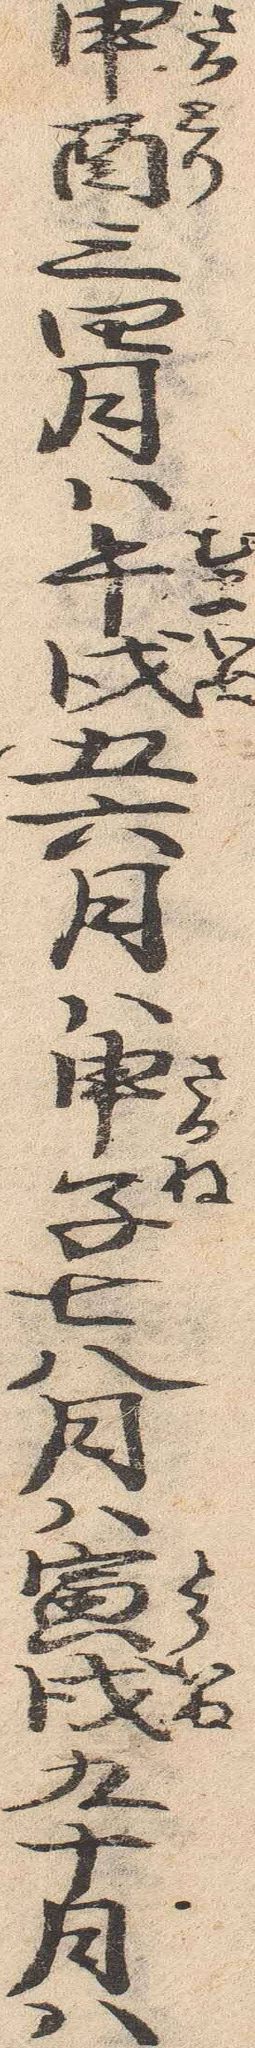申酉三四月は午戌五六月は申子七八月は寅戌九十月は
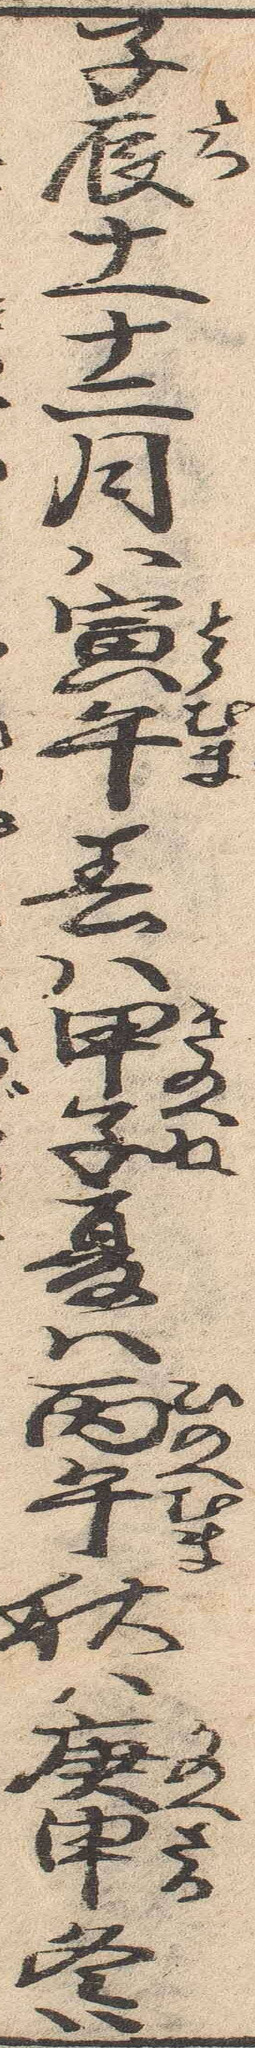子辰十一十二月は寅午春は甲子夏は丙午秋は庚申冬は
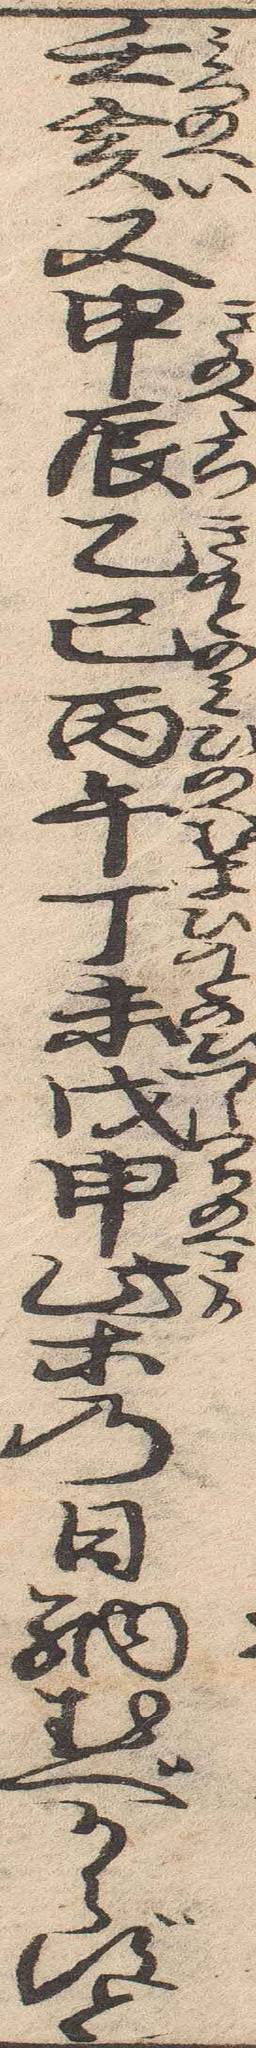壬亥又申辰乙巳丙午丁未戊申此等の日納むべからずと
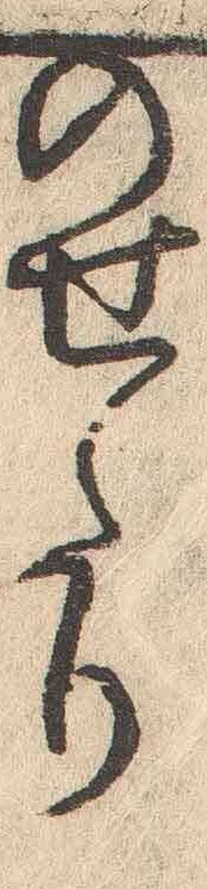のせたり
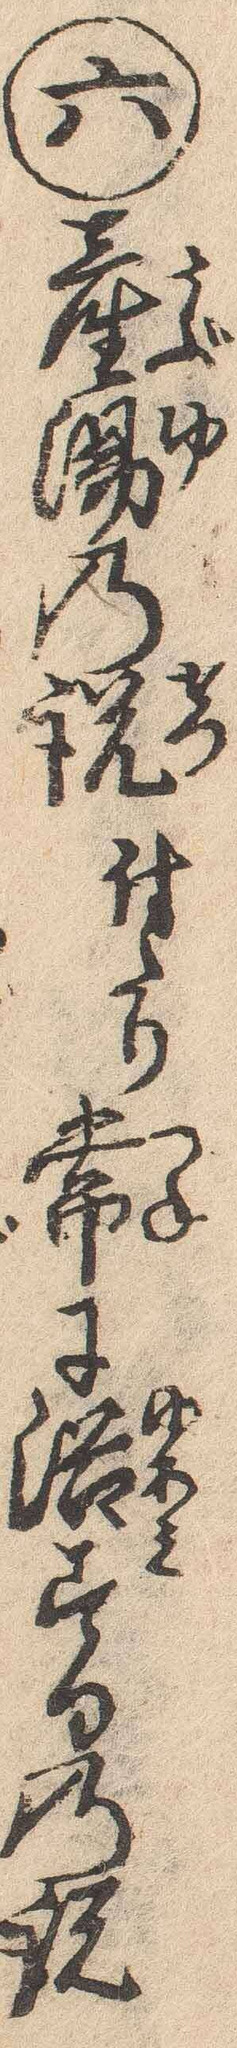㊅産湯の説付たり常に浴するの説
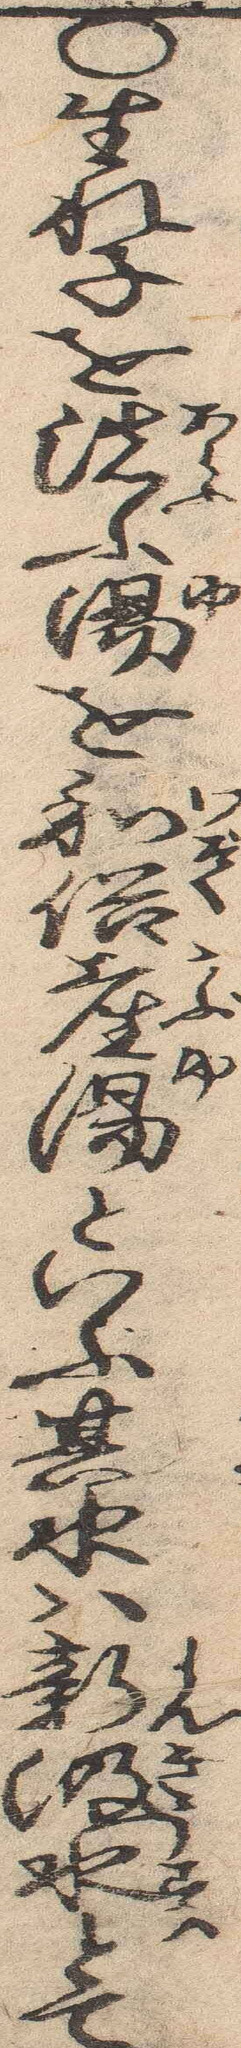◯生れ子を洗ふ湯を和俗産湯といふ其水は新汲水とて
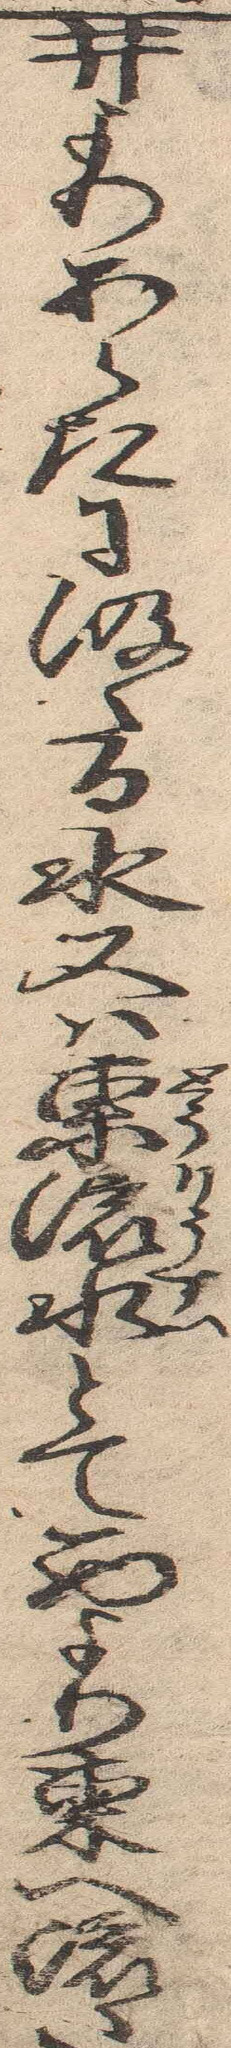井よりあらたに汲たる水又は東流水とて西より東へ流た
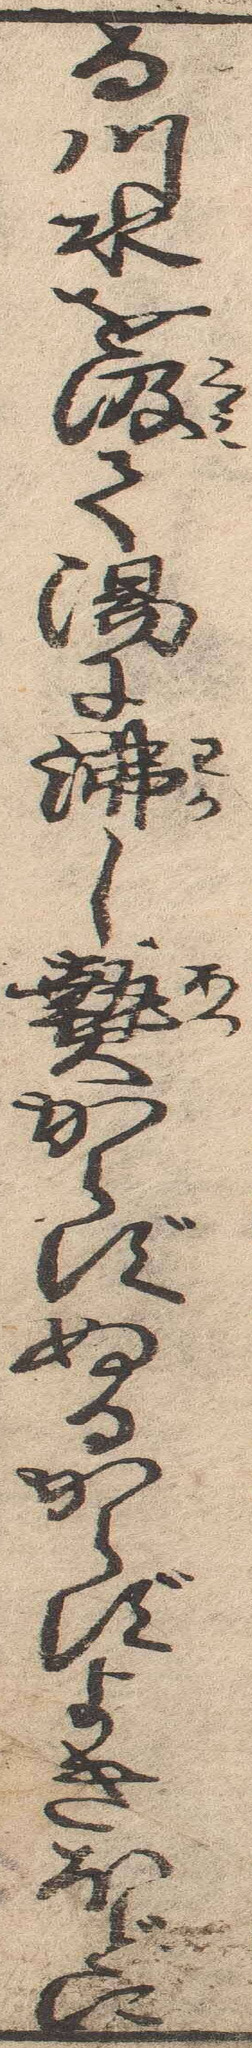る川水を汲て湯に沸し熱からずぬるからずよきほどに
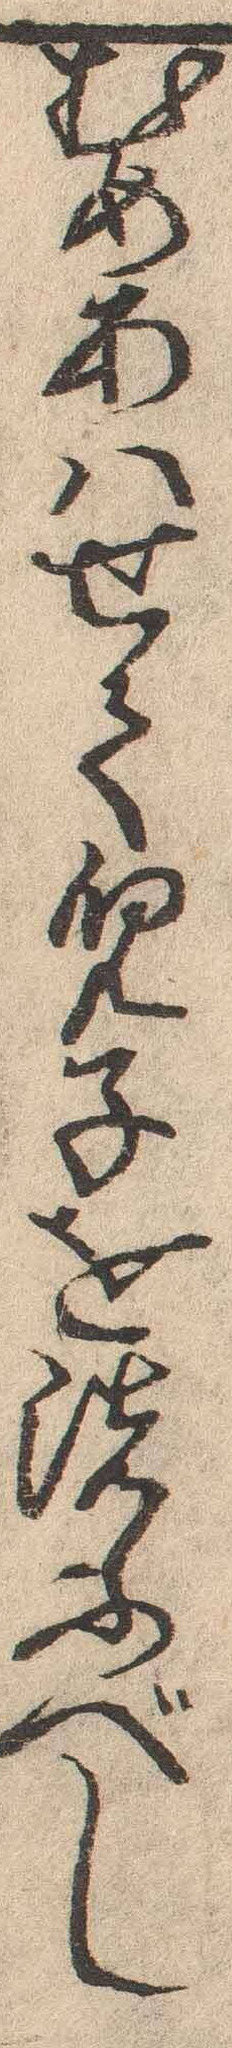むめあはせて児子を洗ふべし

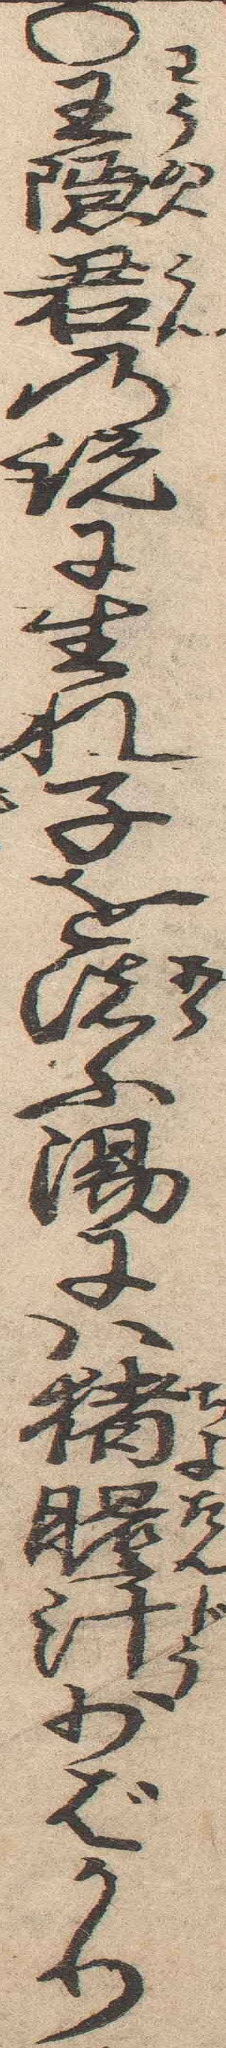◯王隠君の説に生れ子を洗ふ湯には猪膽汁少ばかり
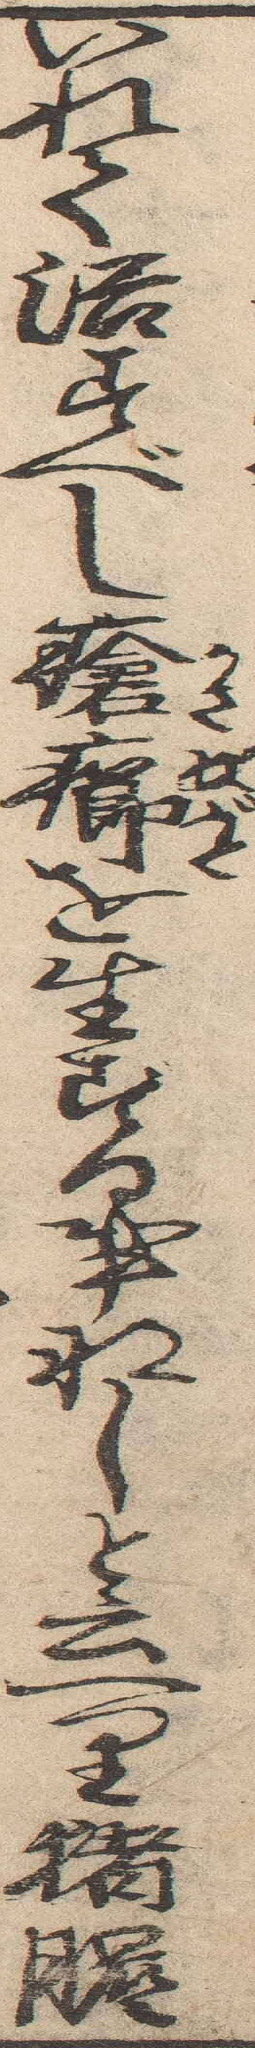いれて浴すべし瘡癤を生する事なしと云へり猪膽
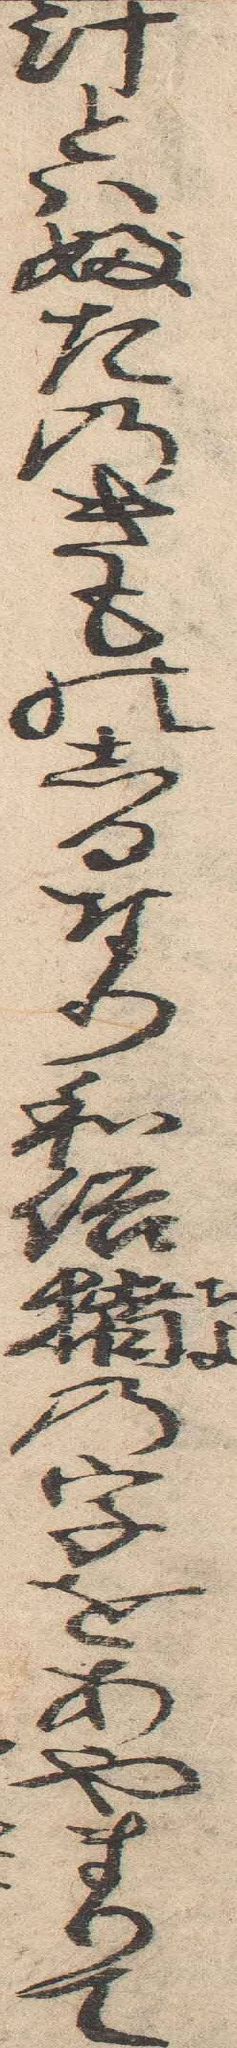汁とはぶたのきものしるなり和俗猪の字をあやまりて
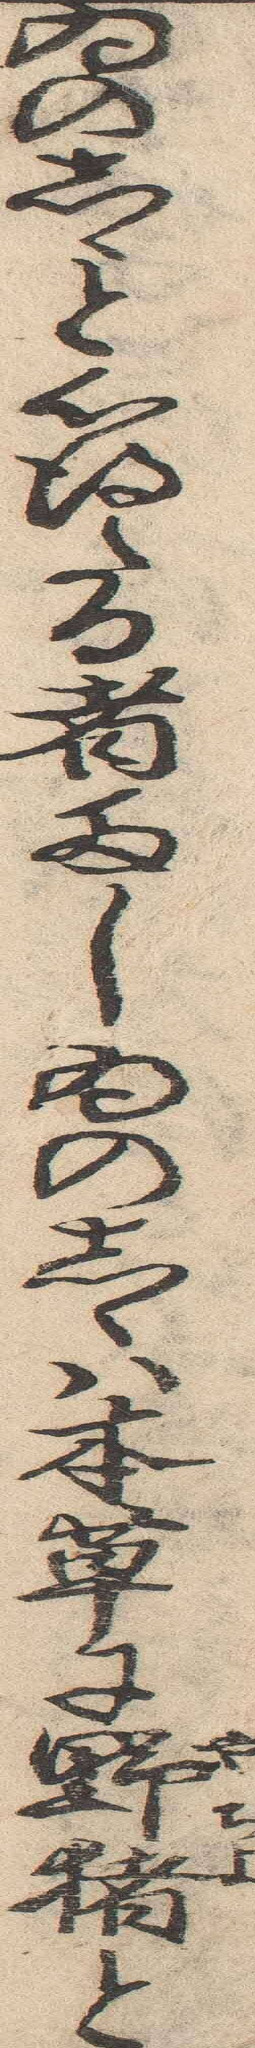ゐのしゝと心得たる者多しゐのしゝは本草に野猪と
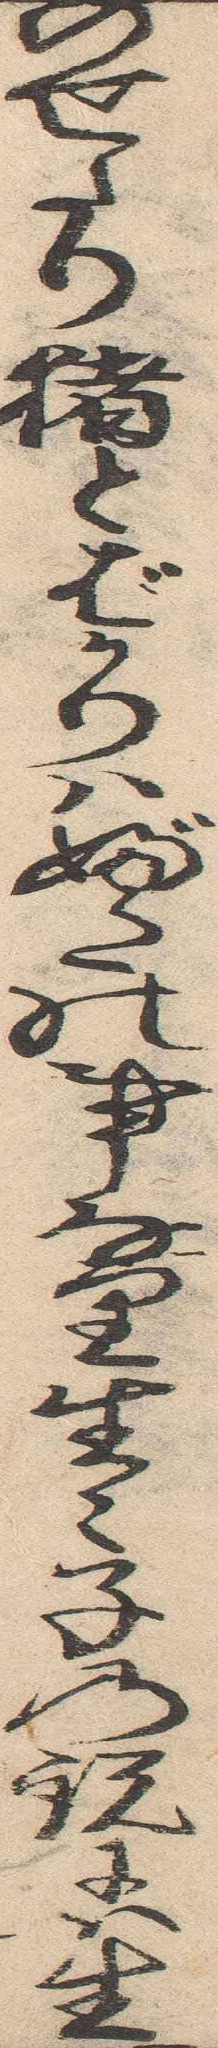のせたり猪とばかりはぶたの事なり生々子の説には生
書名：小児必用養育草
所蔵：東京学芸大学附属図書館 国文学研究資料館
